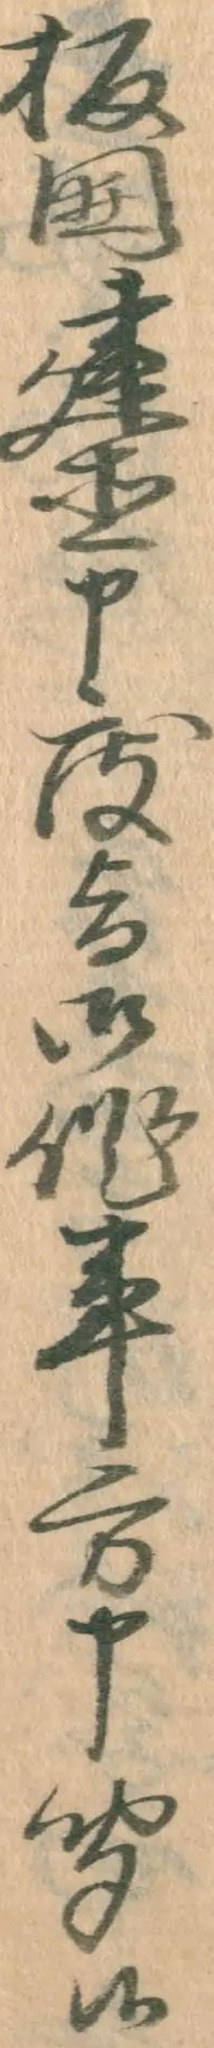板囲建直申度旨御作事方申聞候
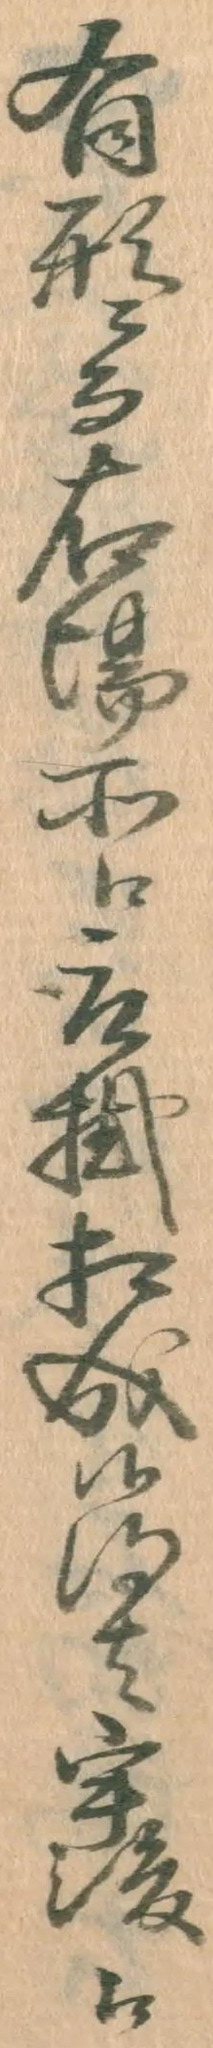有形ニて右場所え取掛相成候得は牢後え
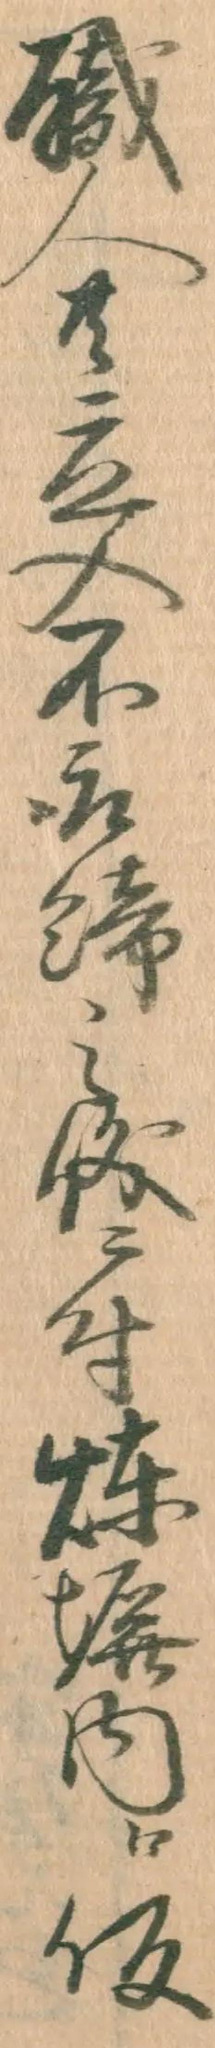職人共立入不取締之儀ニ付煉塀内え御仮
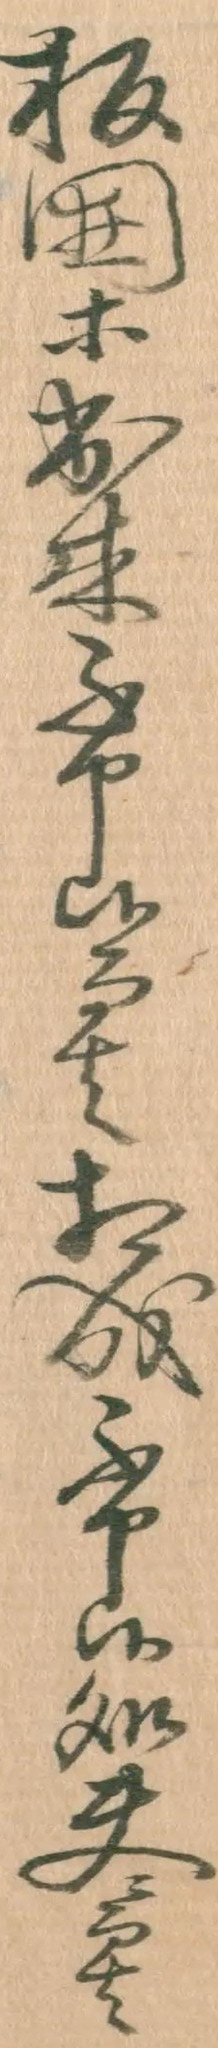板囲等出来不申候ては相成不申候処夫ニては
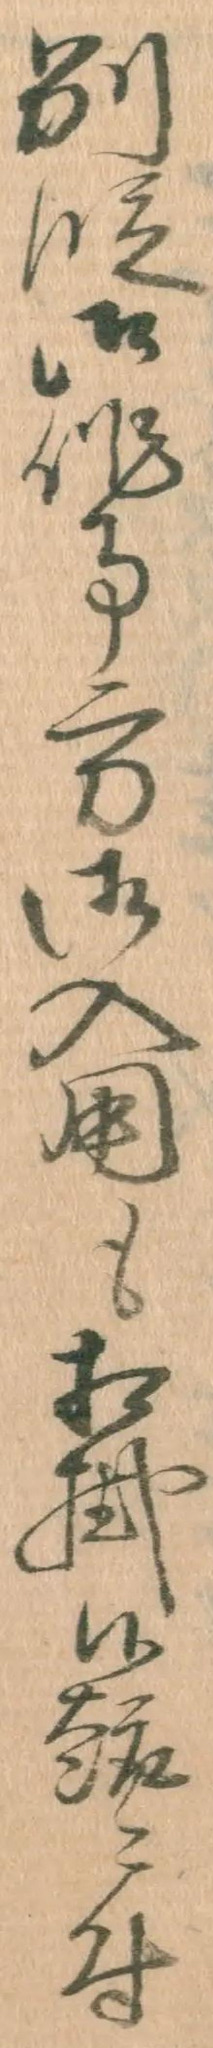別段御作事方御入用も相掛候趣ニ付
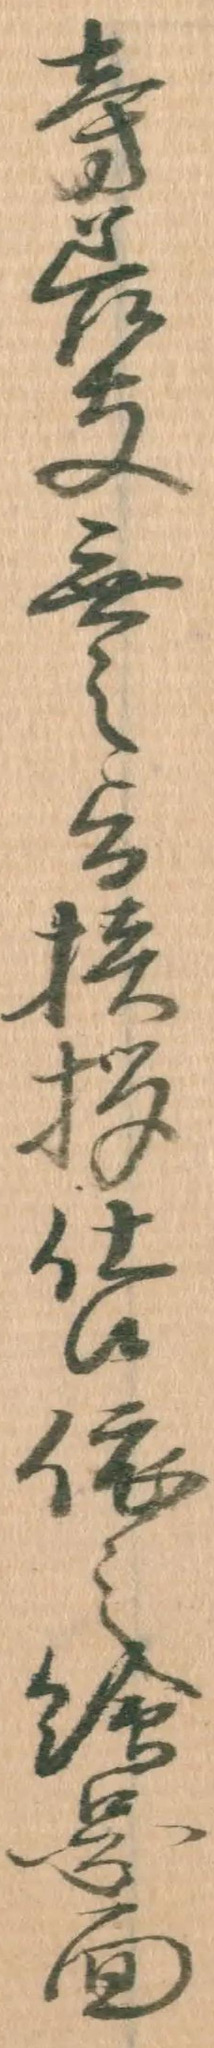旁差支無之旨挨拶仕候依之絵図面
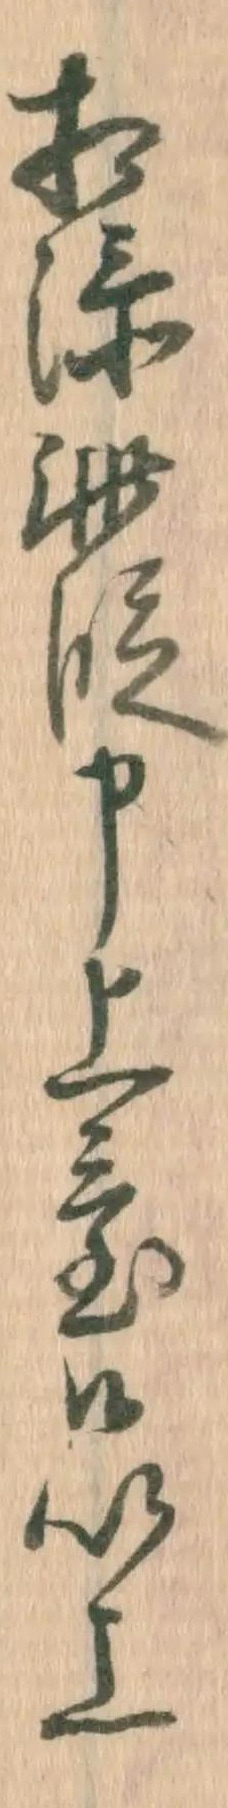相添此段申上置候以上
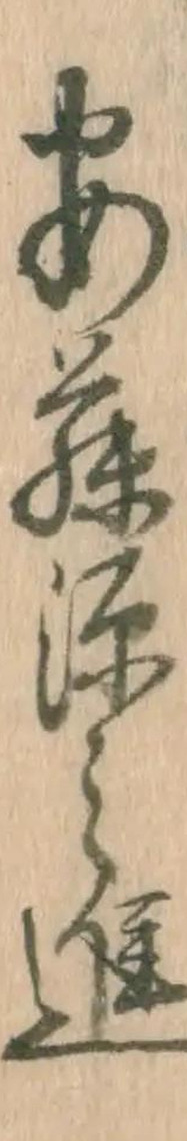安藤源之進

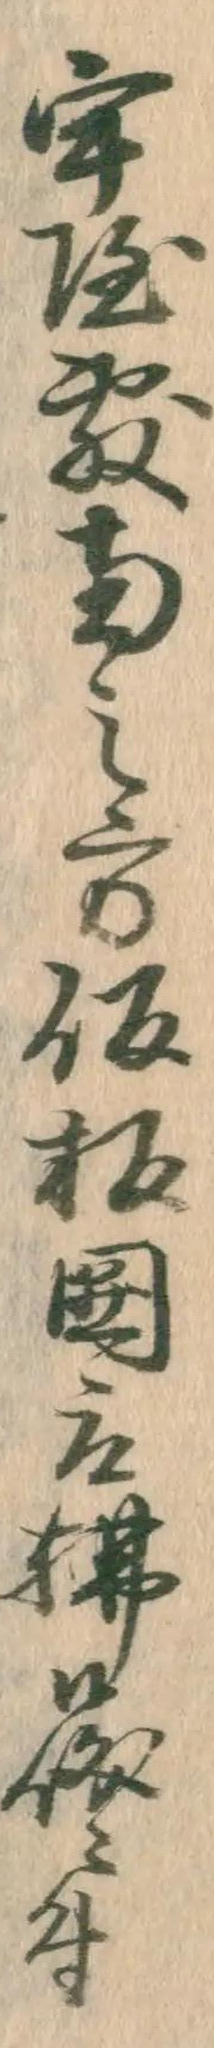│牢屋敷南之方仮板囲取払候儀ニ付
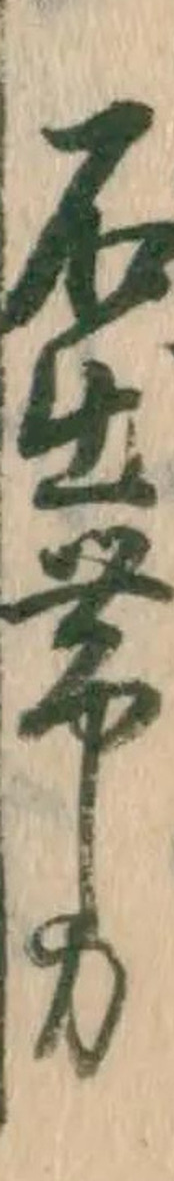│石出帯刀
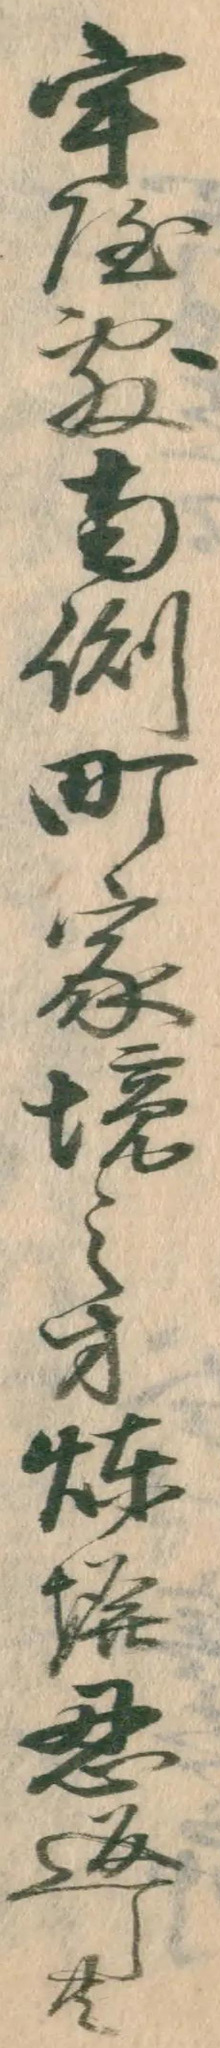牢屋敷南側町家境之方煉塀忍返し共
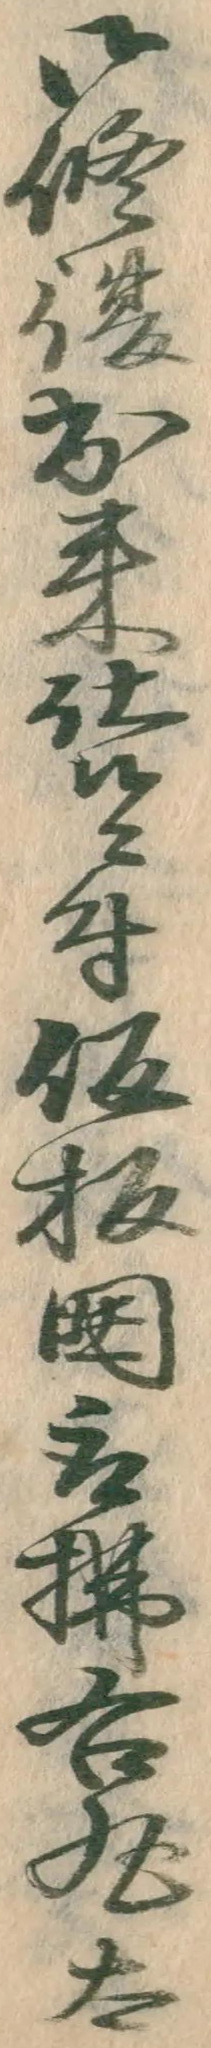御修復出来仕候ニ付仮板囲取払右丸太

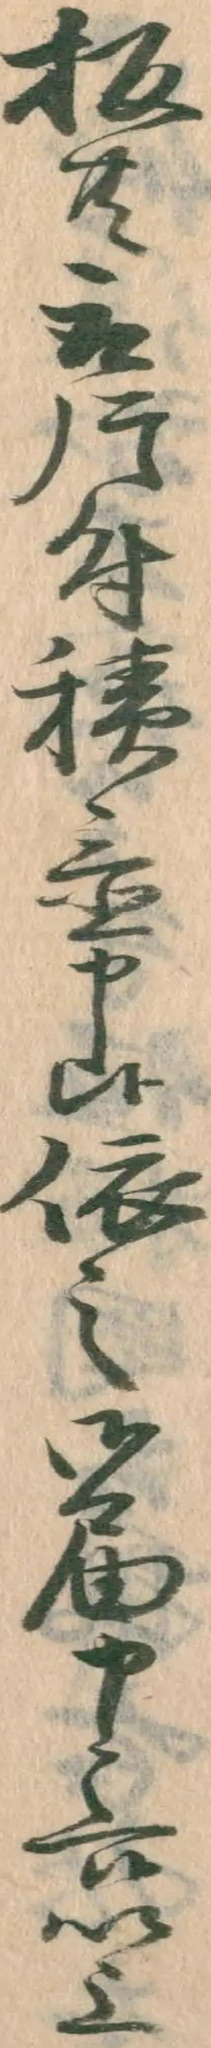板共取片付積置申候依之御届申上候以上
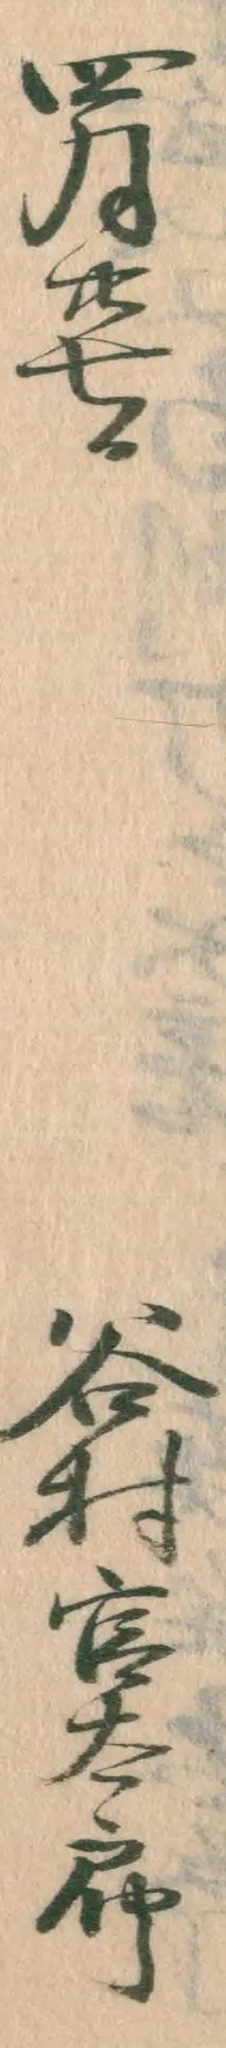四月廿七日谷村官太郎
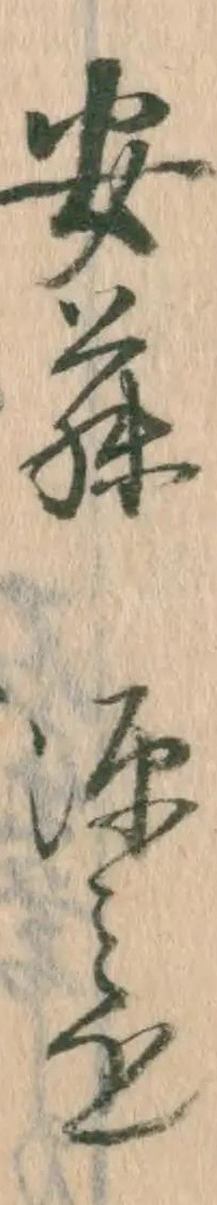安藤源之進
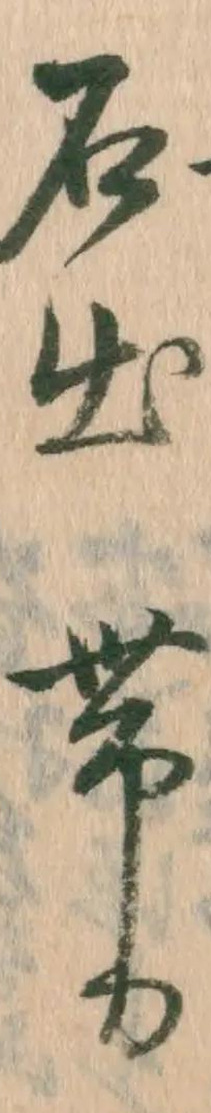石出帯刀
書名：七十冊物類集 71巻. [44] 四十三 牢屋敷御普請御修覆地震ニ付骨折候牢屋掛御褒美之部
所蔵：国立国会図書館 National Diet Library, JAPAN
